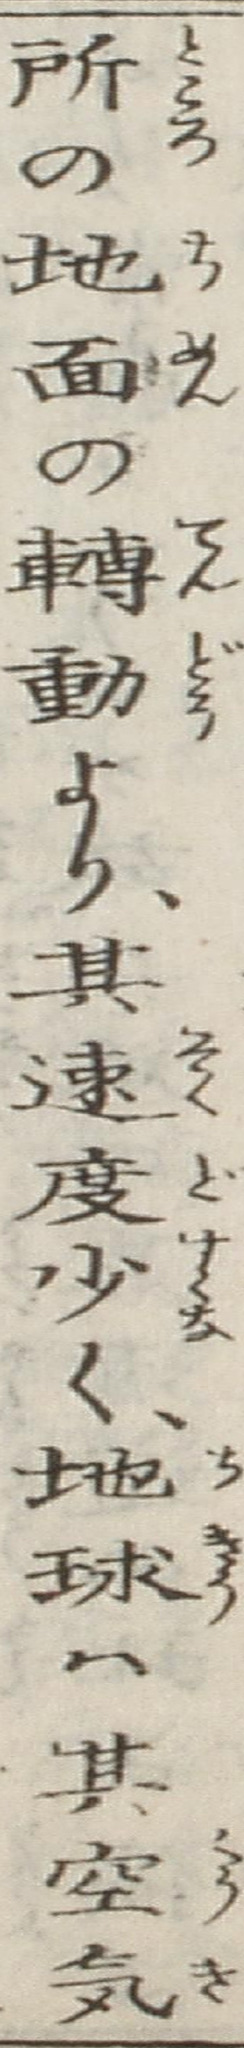所の地面の転動より、其速度少く、地球は其空気
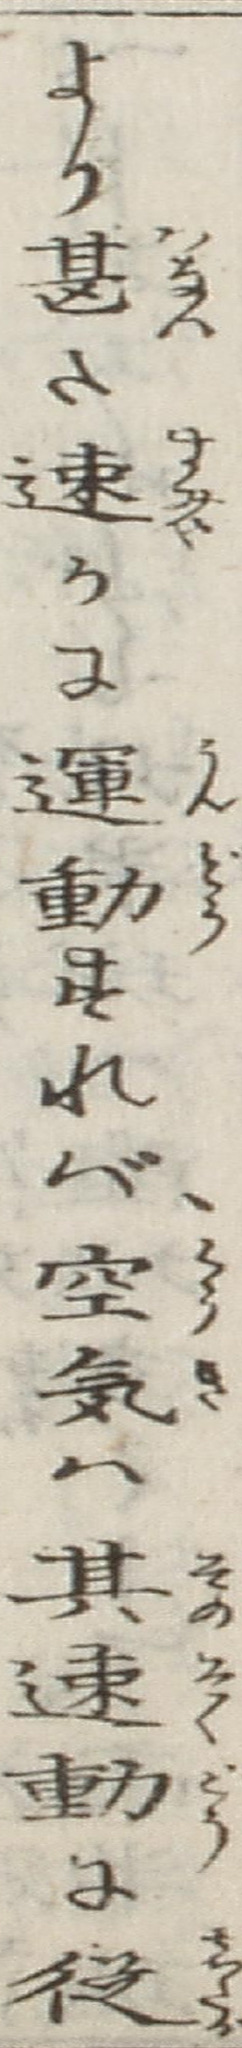より甚だ速かに運動すれば、空気は其速動に従
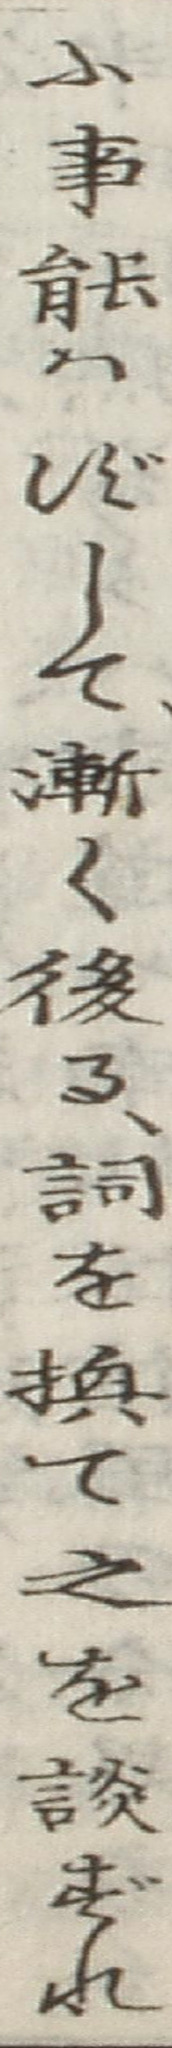ふ事能はずして、漸く後る、詞を換て之を談ずれ
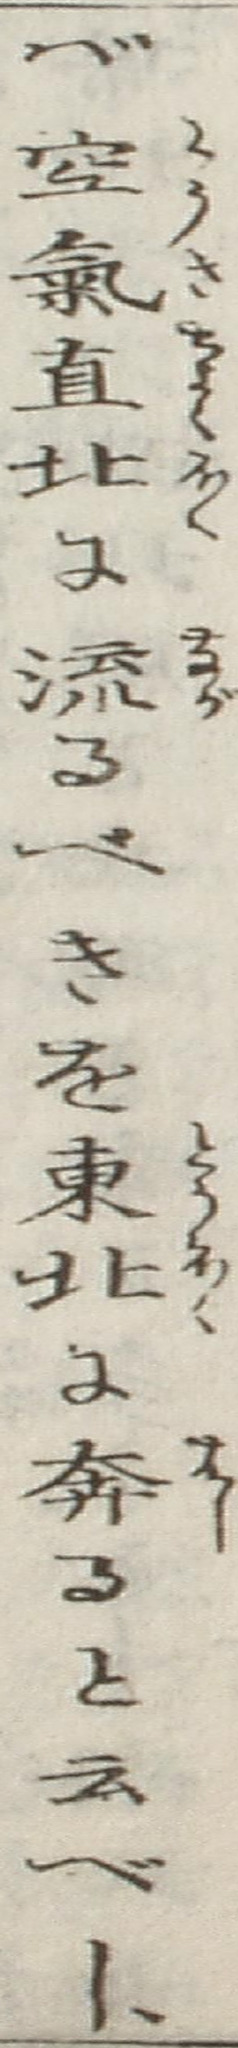ば空気直北に流るべきを東北に奔ると云べし、
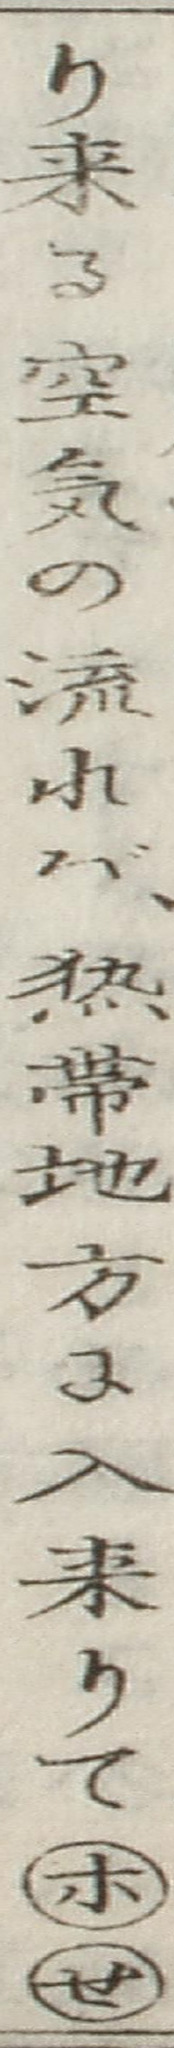り来る空気の流れは、熱帯地方に入来りて、ホせ
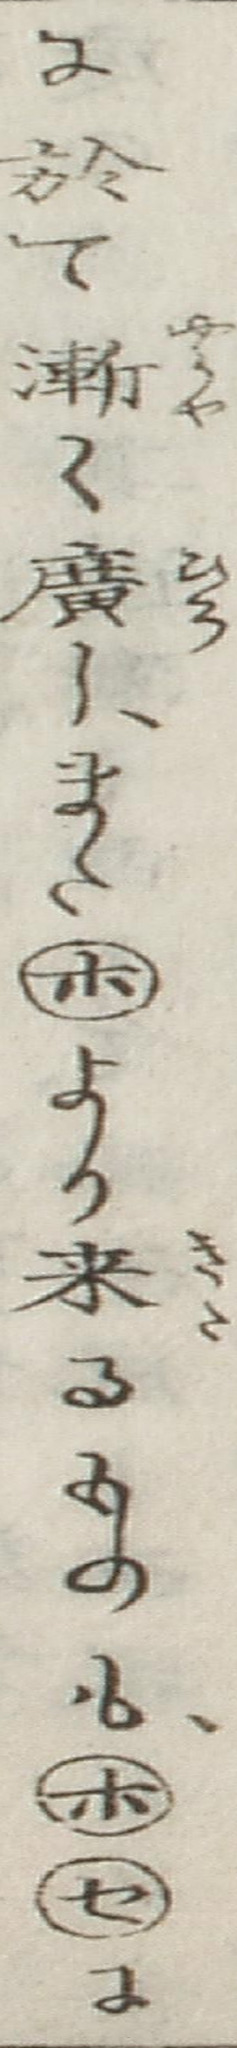に於て漸く広し、またホより来るものも、ホセに
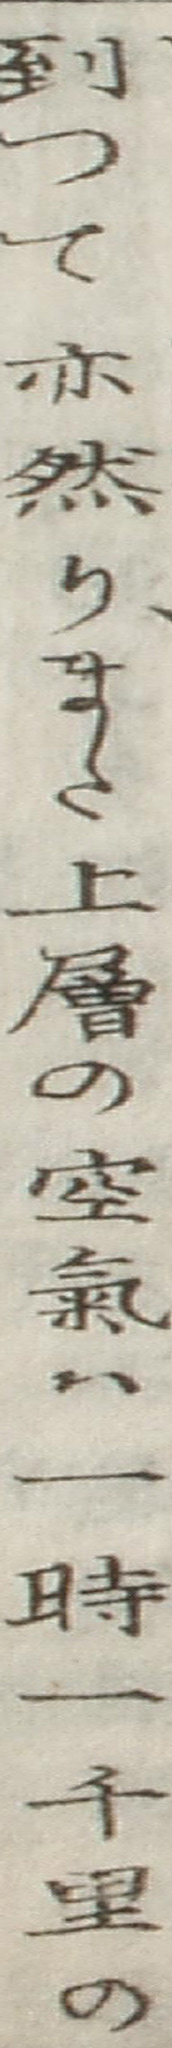到つて亦然り、また上層の空気は、一時一千里の

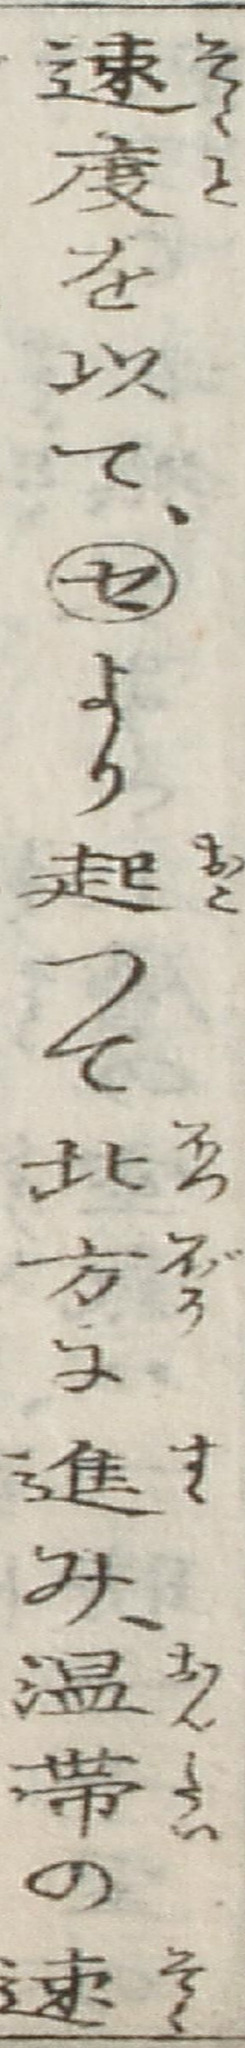速度を以て、セより起つて北方に進み、温帯の速
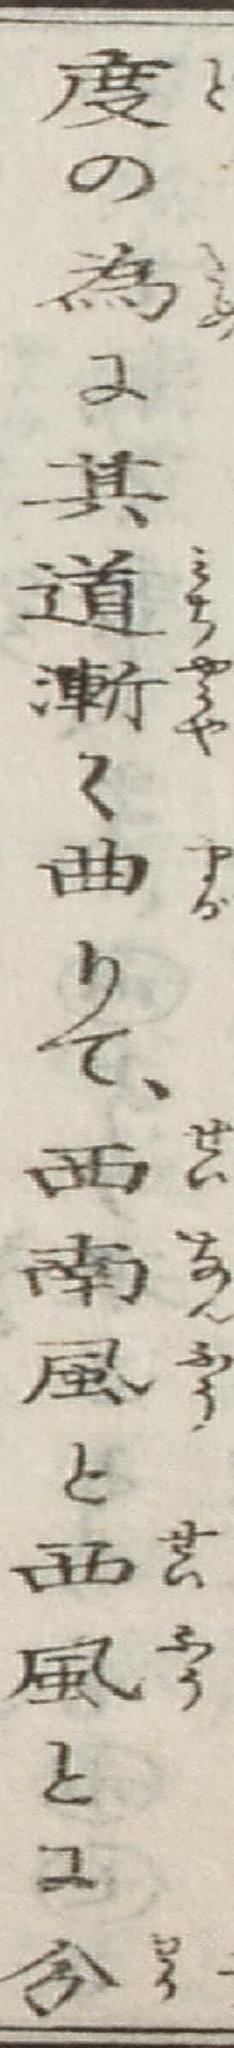度の為に其道漸く曲りて、西南風と西風とに分
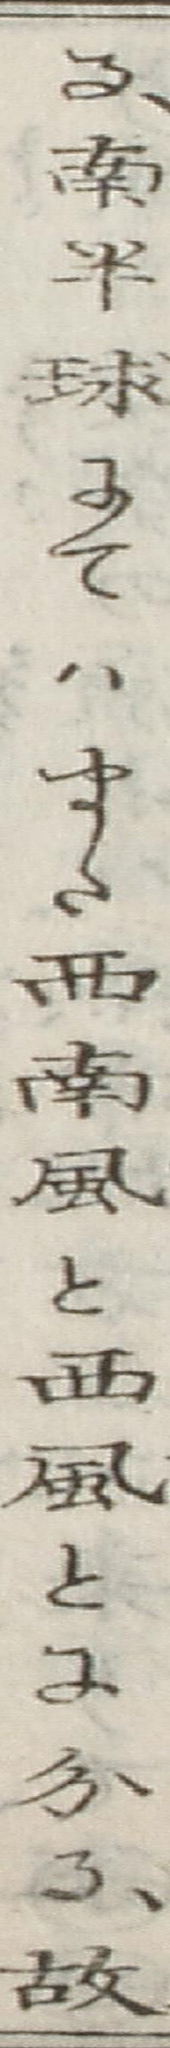る、南半球にてはまた西南風と西風とに分る、故
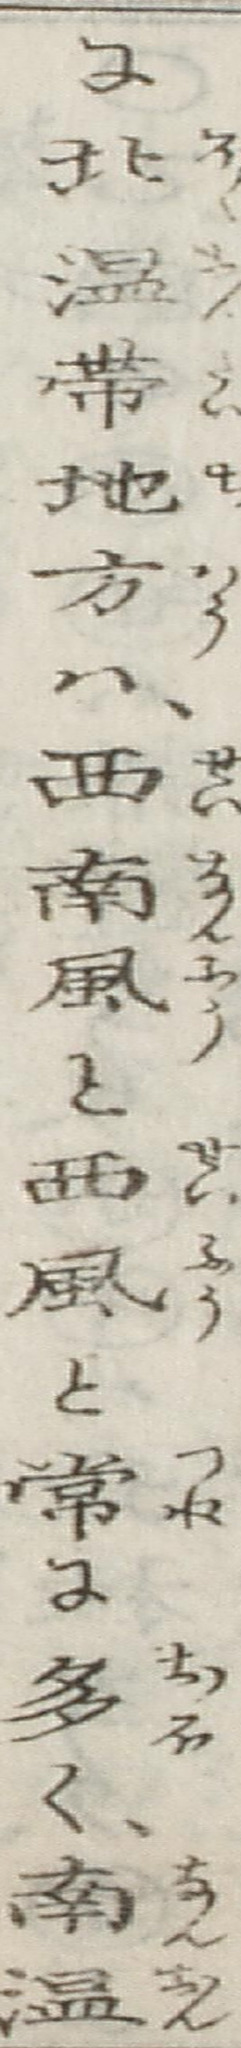に北温帯地方は、西南風と西風と常に多く、南温
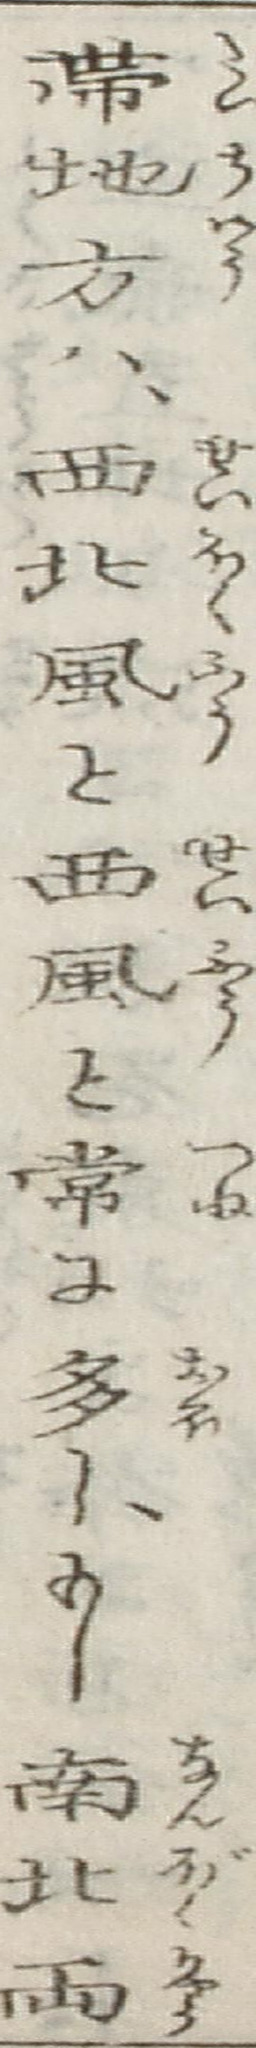帯地方は、西北風と西風と常に多し、もし南北両
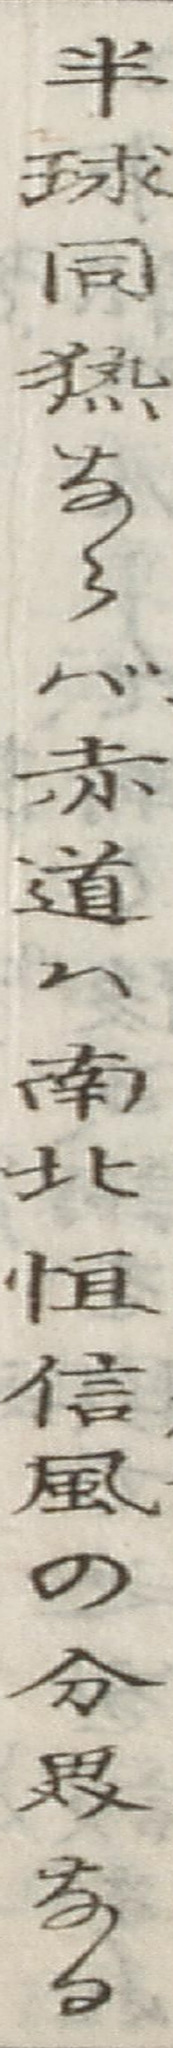半球同熱ならば、赤道は南北恒信風の分界なる
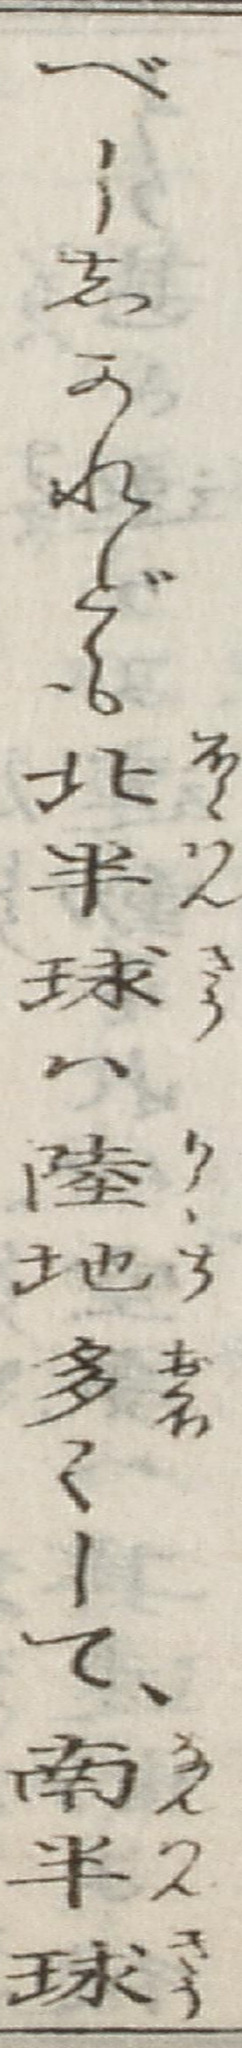べししかれども北半球は陸地多くして、南半球
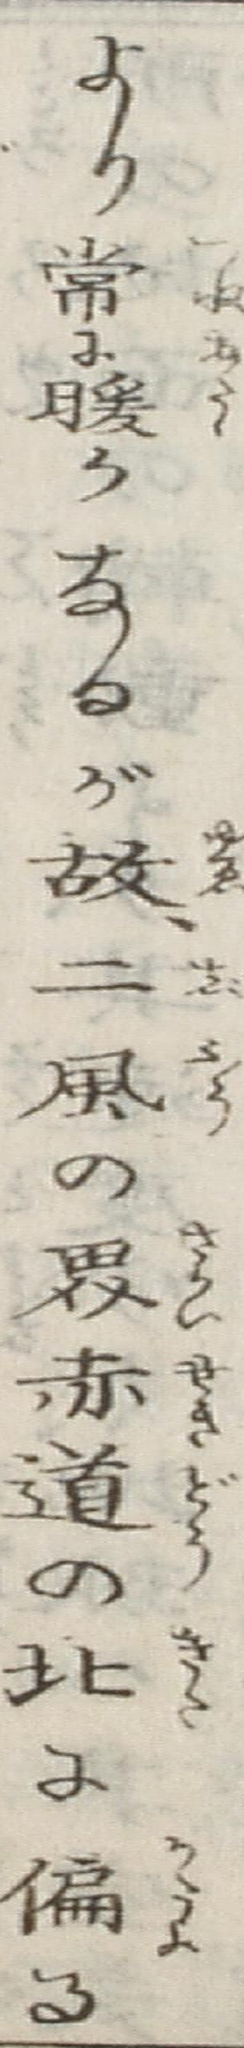より常に暖かなるが故、二風の界赤道の北に偏る
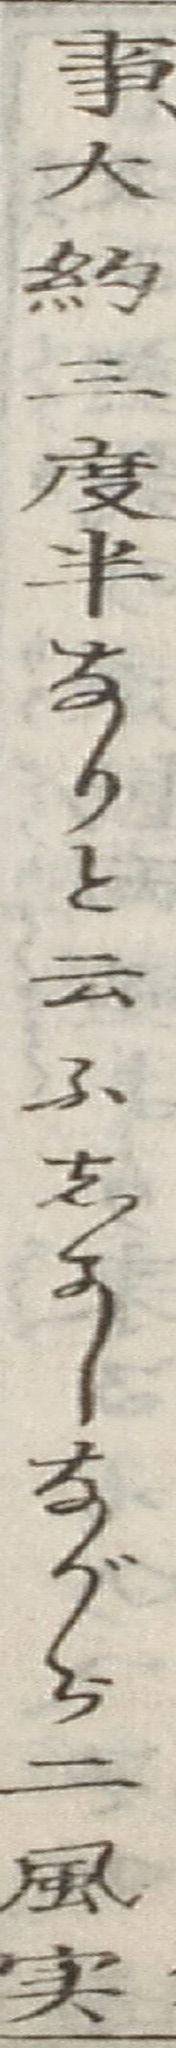事、大約三度半なりと云ふ、しかしながら二風実
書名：訓蒙　天然地理學　中
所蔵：東京大学地震研究所図書室 Earthquake Research Institute Library, The University of Tokyo, JAPAN
